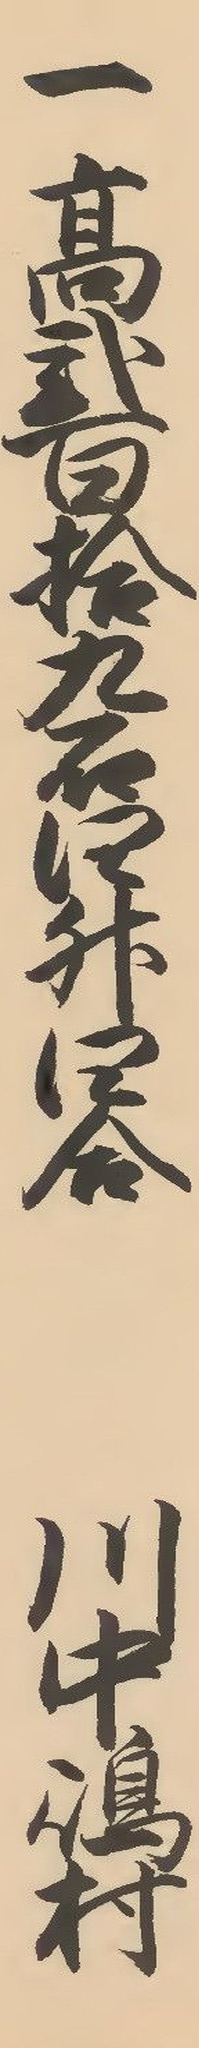一高弐百拾九石四升四合川中嶋村
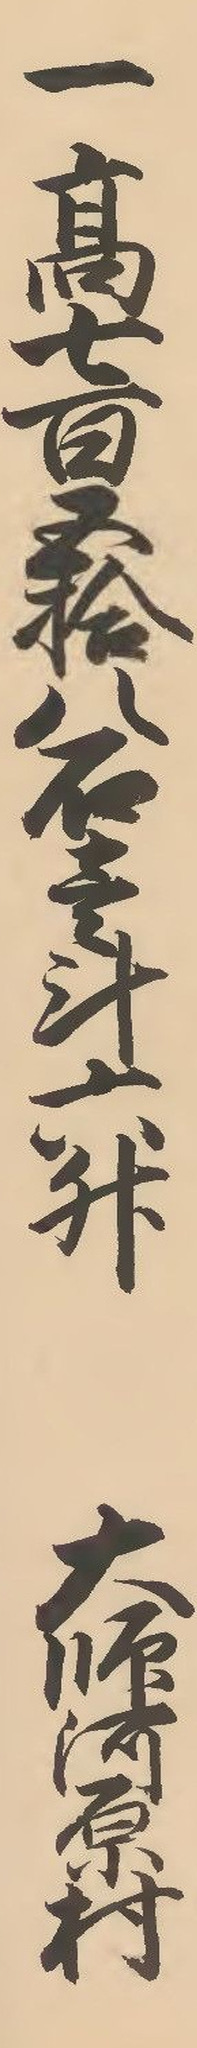一高七百五拾八石壱斗六升大師河原村
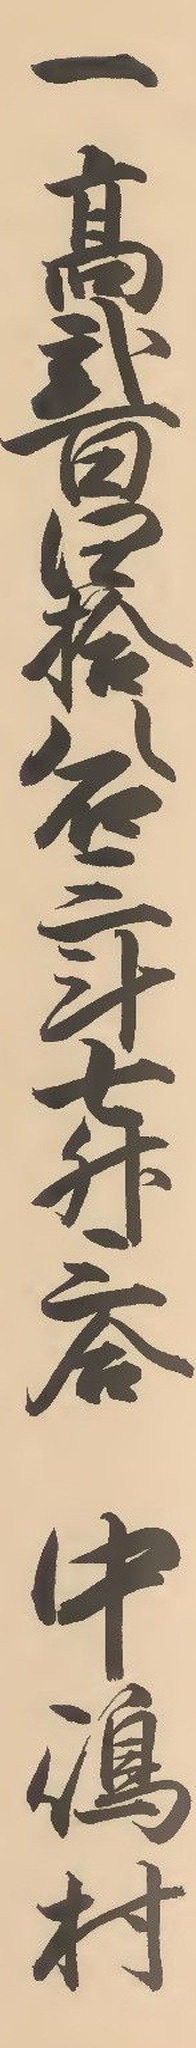一高弐百四拾八石三斗七升三合中嶋村
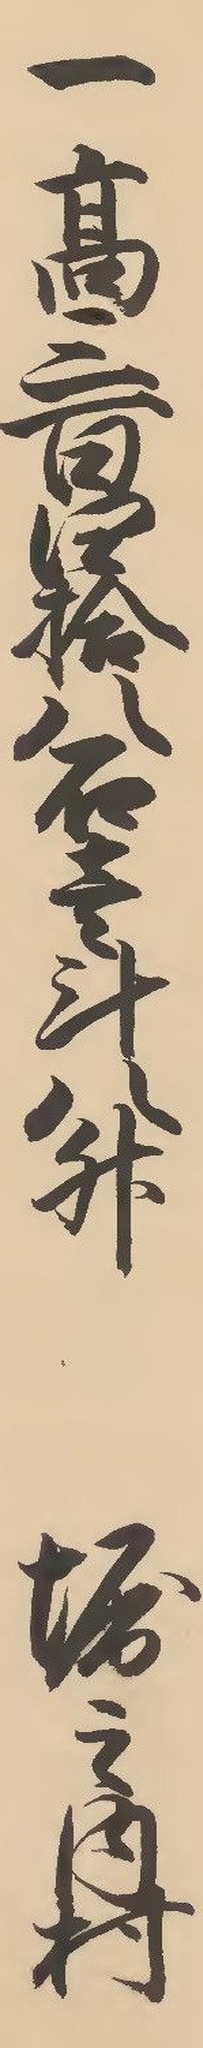一高三百四拾八石壱斗八升堀之内村
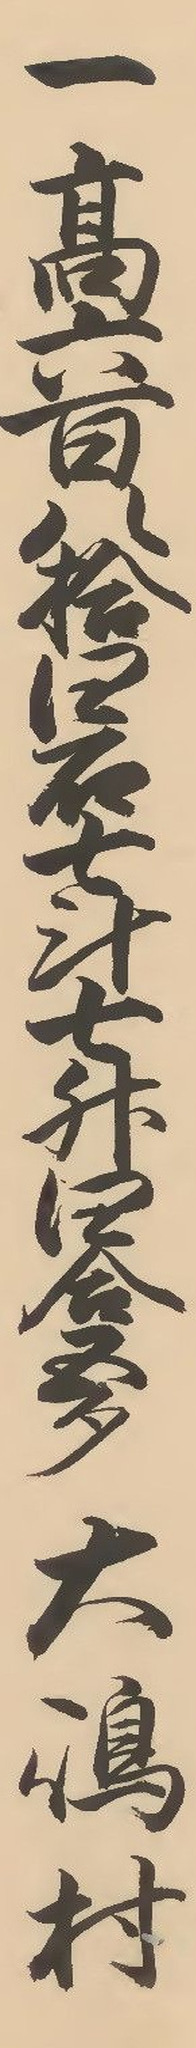一高六百八拾四石七斗七升四合五勺大嶋村
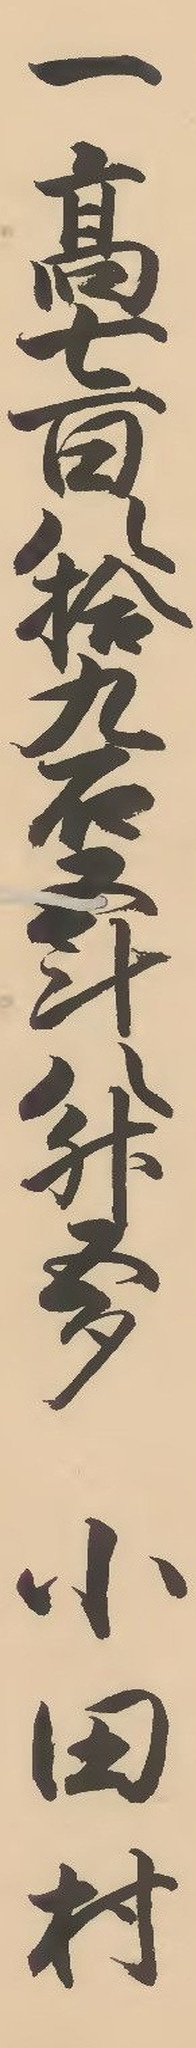一高七百八拾九石五斗八升五勺小田村

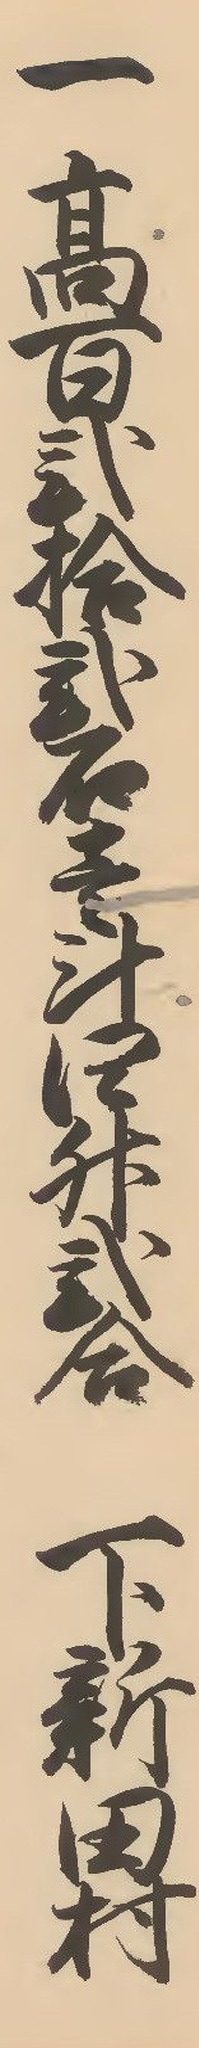一高百弐拾弐石壱斗四升弐合下新田村
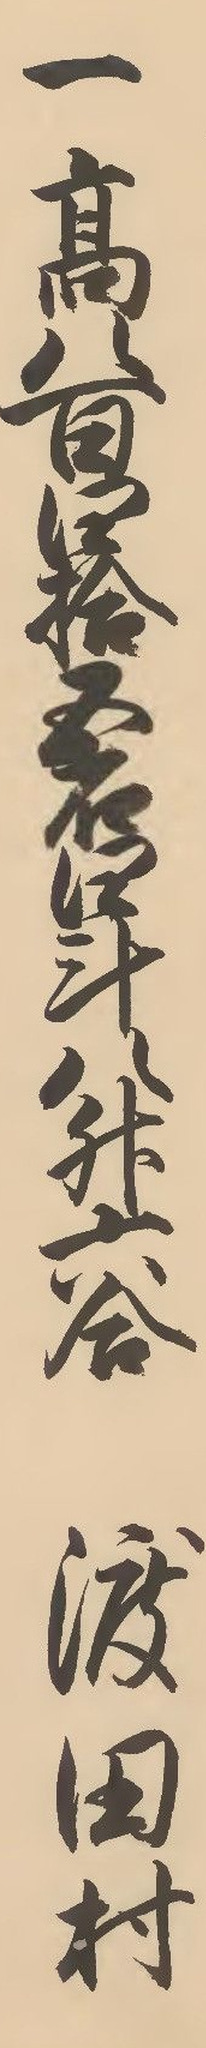一高八百四拾五石四斗八升六合渡田村
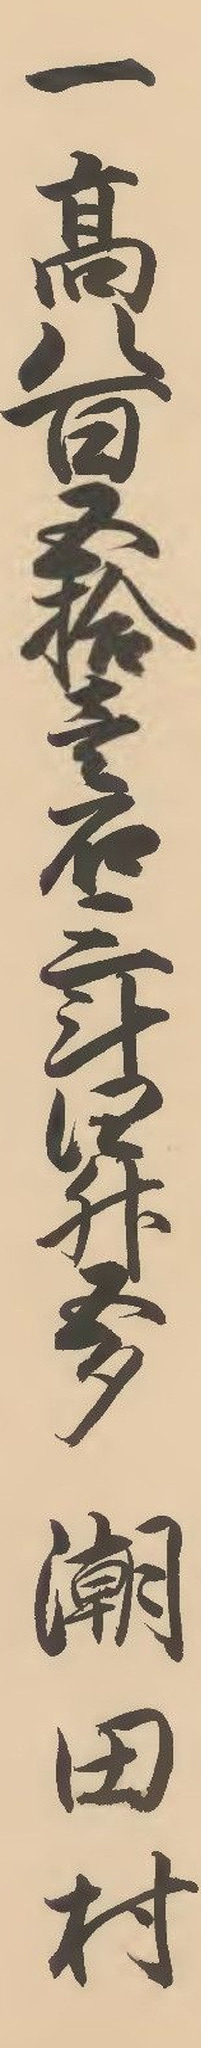一高八百五拾壱石三斗四升五勺潮田村
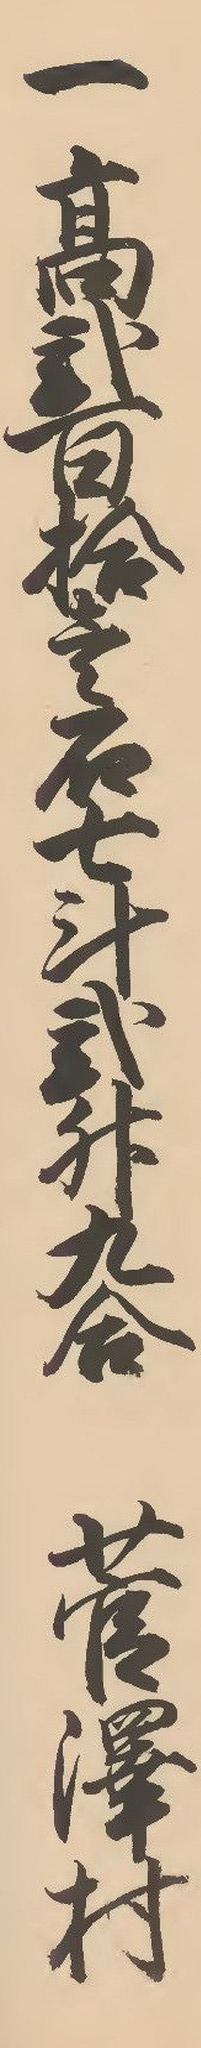一高弐百拾壱石七斗弐升九合菅澤村
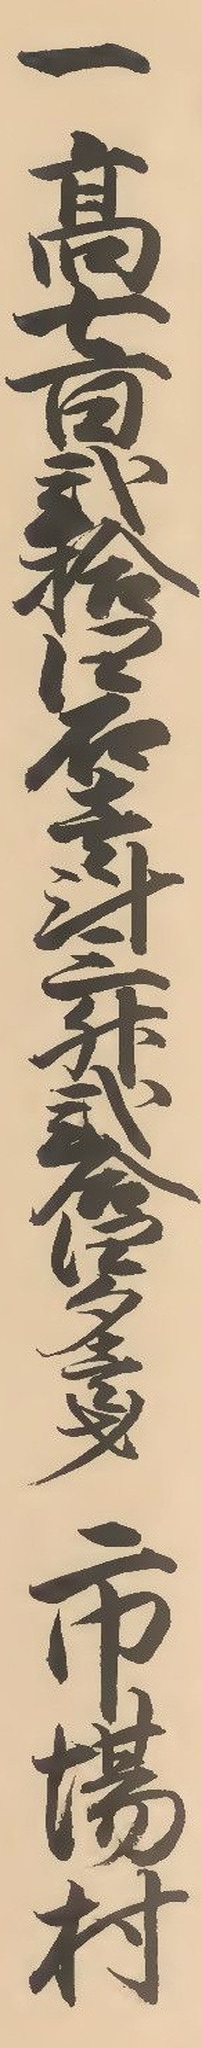一高七百弐拾四石壱斗三升弐合四勺壱才市場村
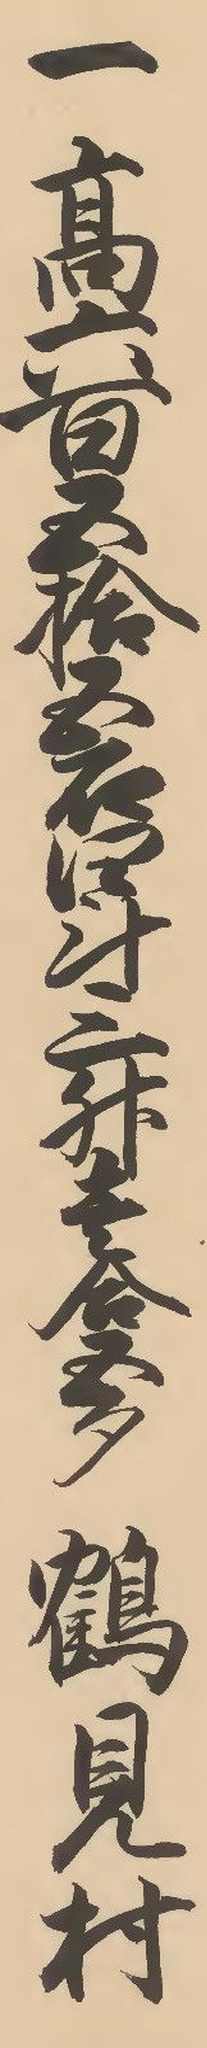一高六百五拾五石四斗三升壱合五勺鶴見村
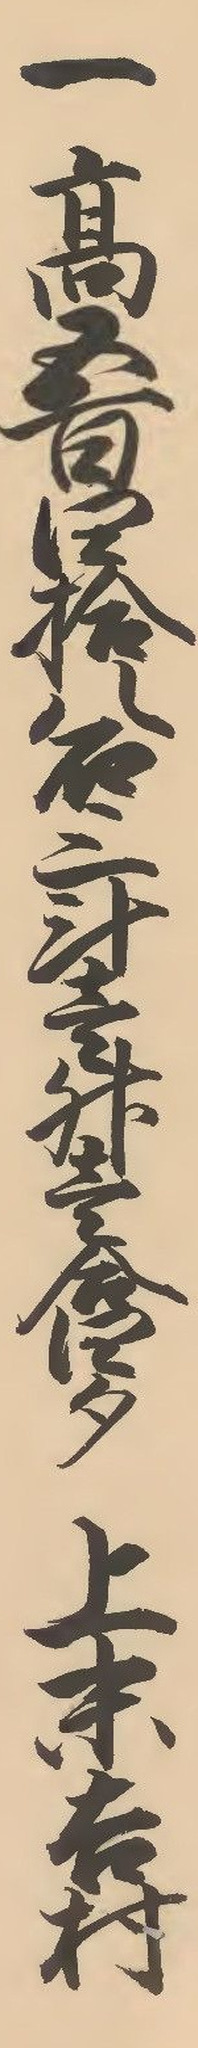一高五百四拾八石三斗壱升壱合四勺上末吉村
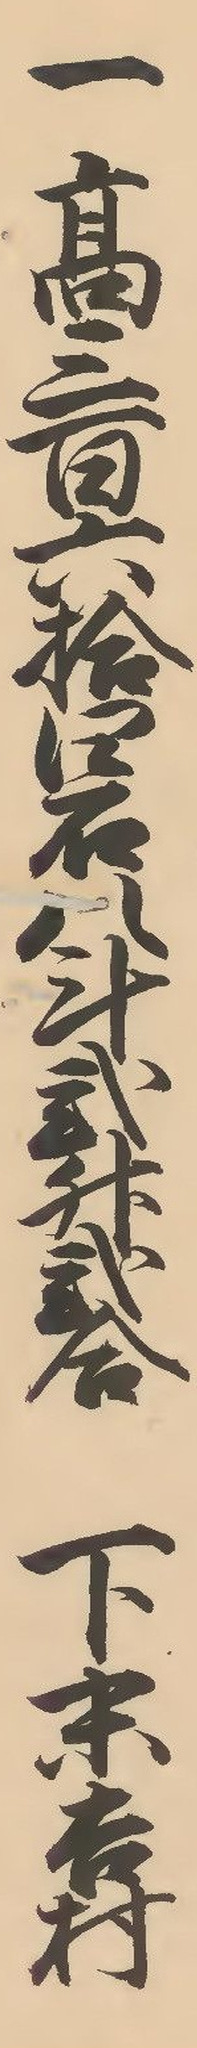一高三百六拾四石八斗弐升弐合下末吉村

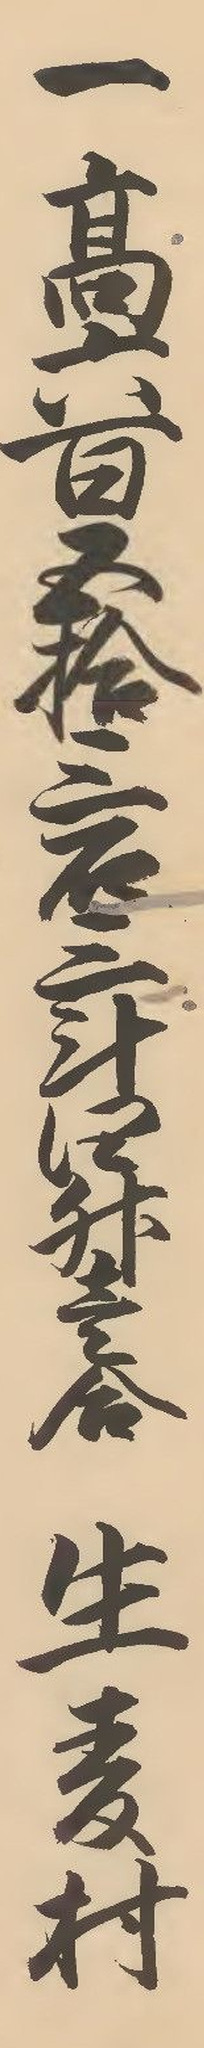一高六百五拾三石三斗四升壱合生麦村
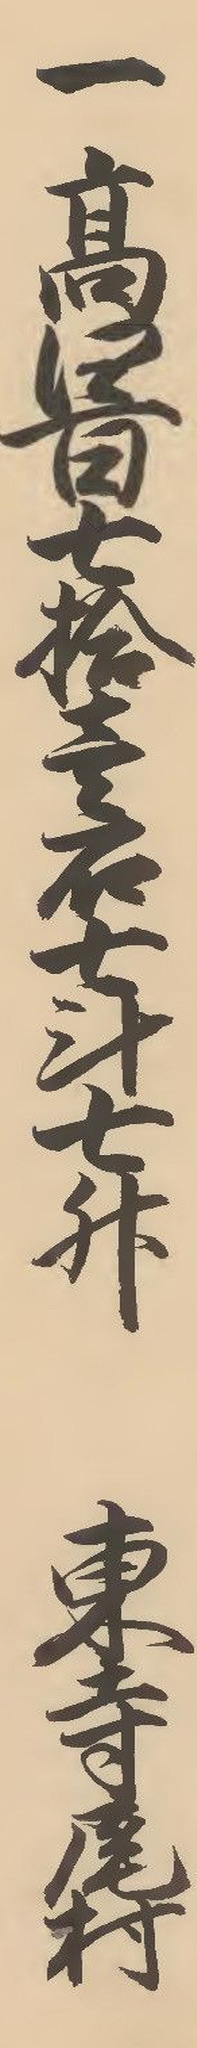一高四百七拾壱石七斗七升東寺尾村
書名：武蔵国郷帳　上
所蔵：国立公文書館 National Archives of Japan
